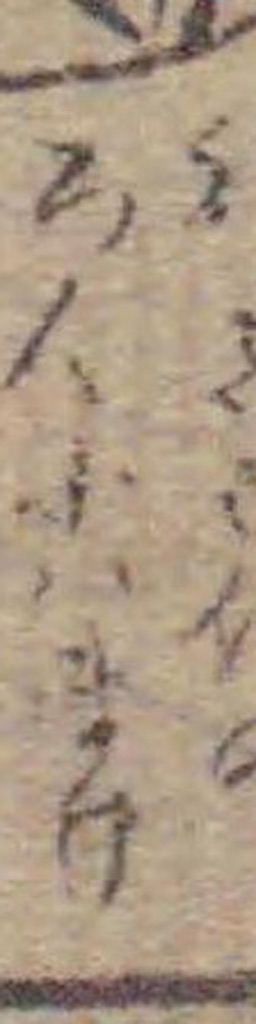ろんにはまけ
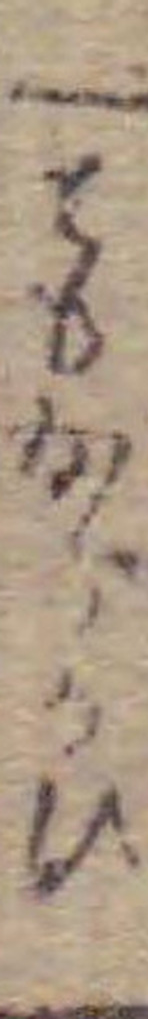てもからかひ
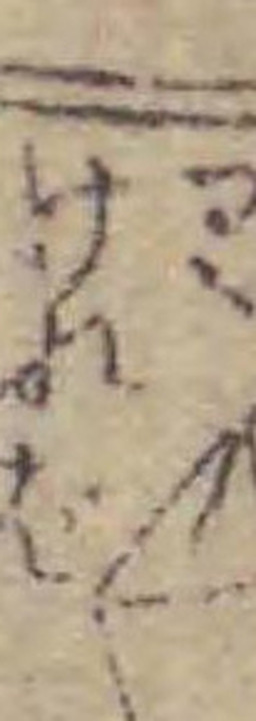ければ
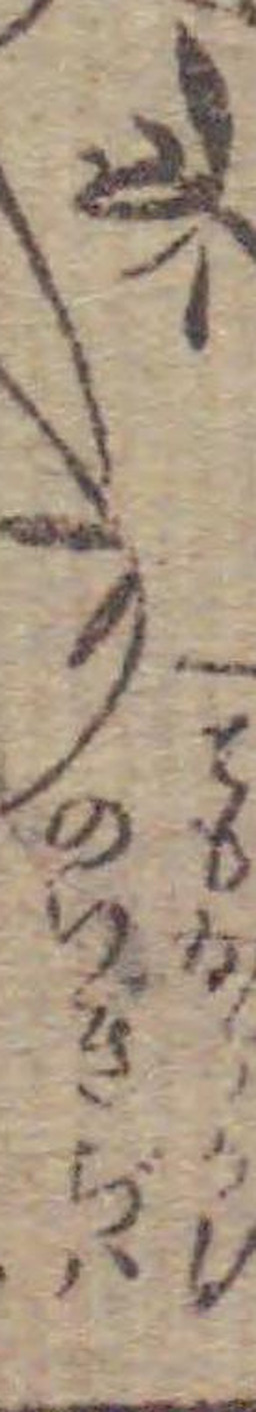のいきぢは
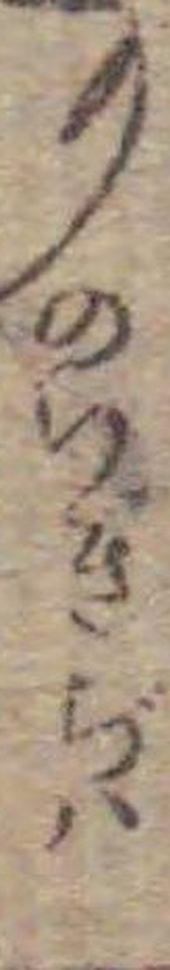のいきぢは
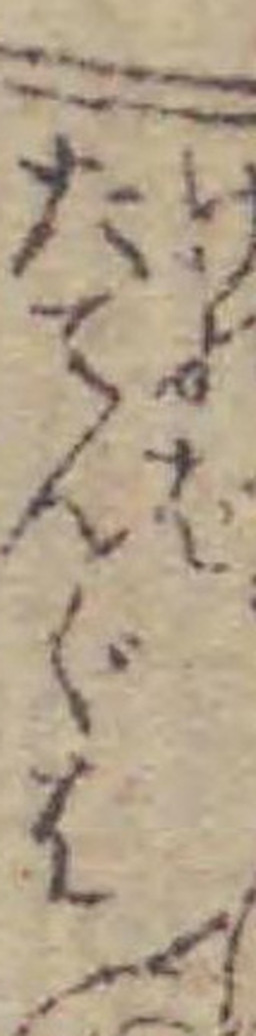大てんぐは
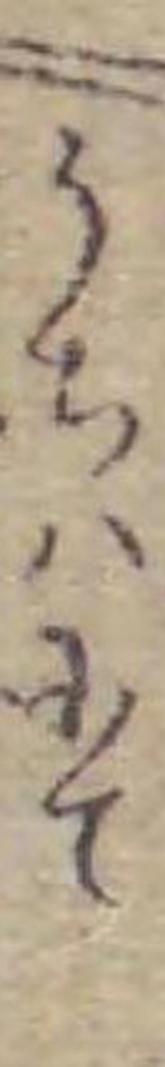うちはにて
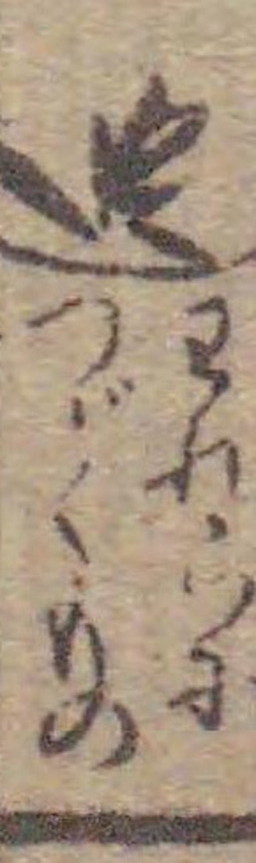つゞくもの
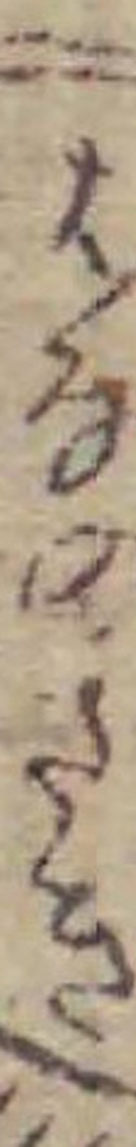はなのさき
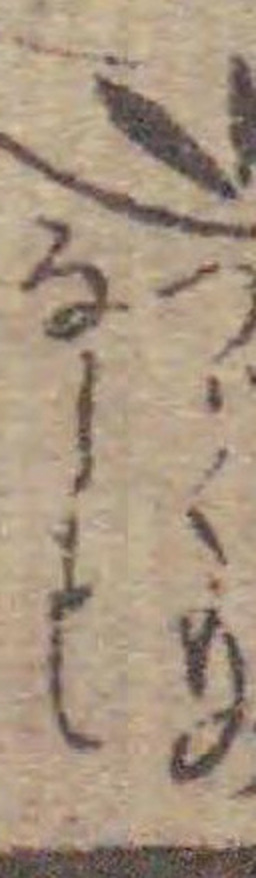なしと
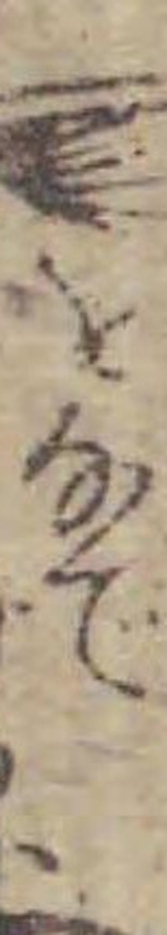をなで
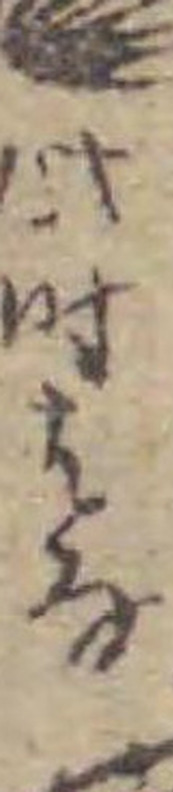此時はな
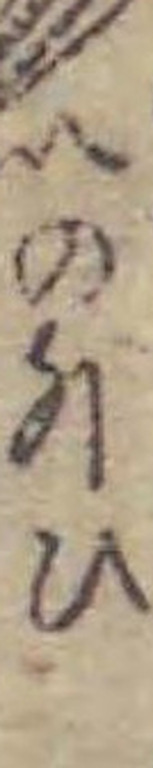いの外ひ
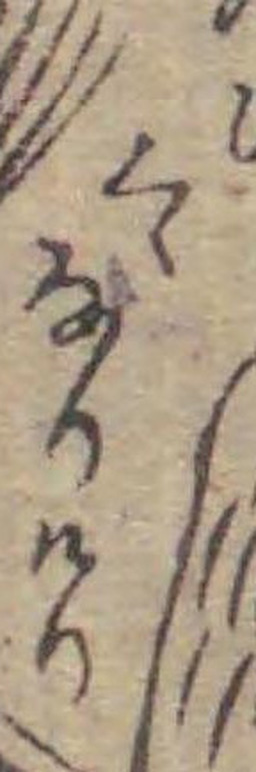なりけり
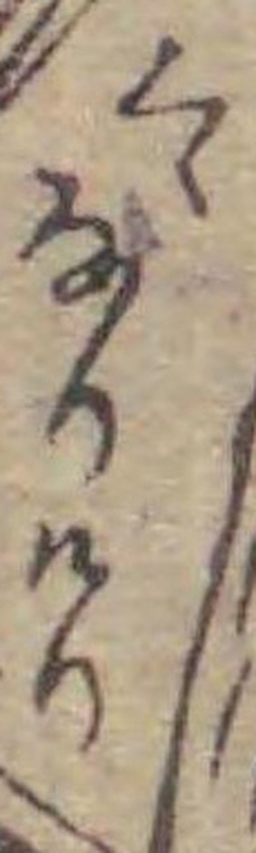なりけり
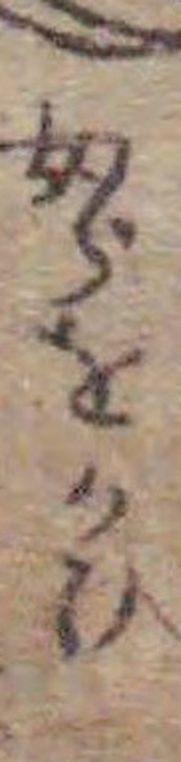女郎をかひ
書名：鼻峰高慢男 : 2巻
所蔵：国立国会図書館 National Diet Library, JAPAN
